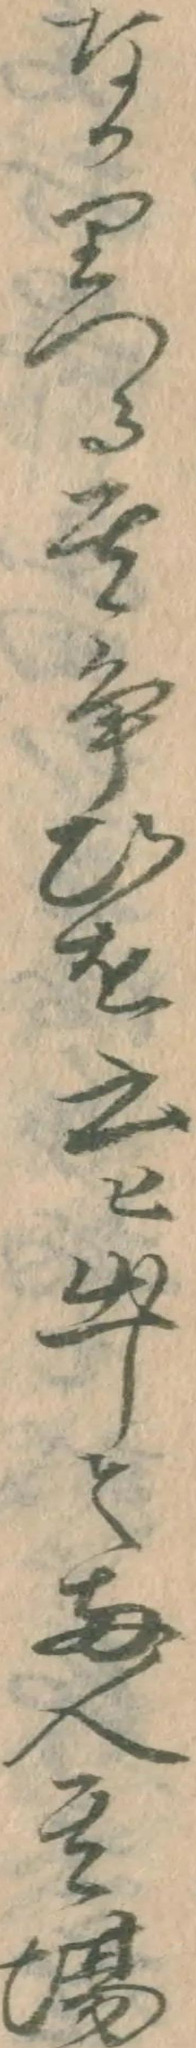なか里つる其争ひを云ひ出して両人其場

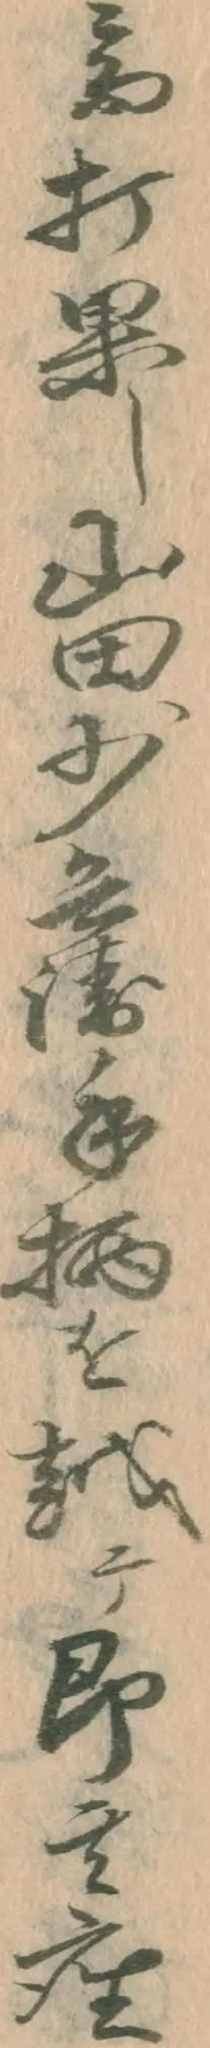に而打果し山田少兵衛手柄を越て即其座
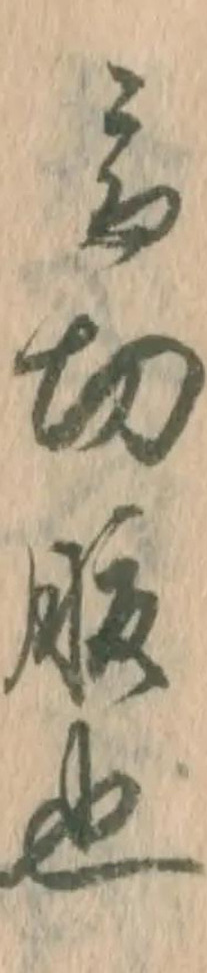に而切服也
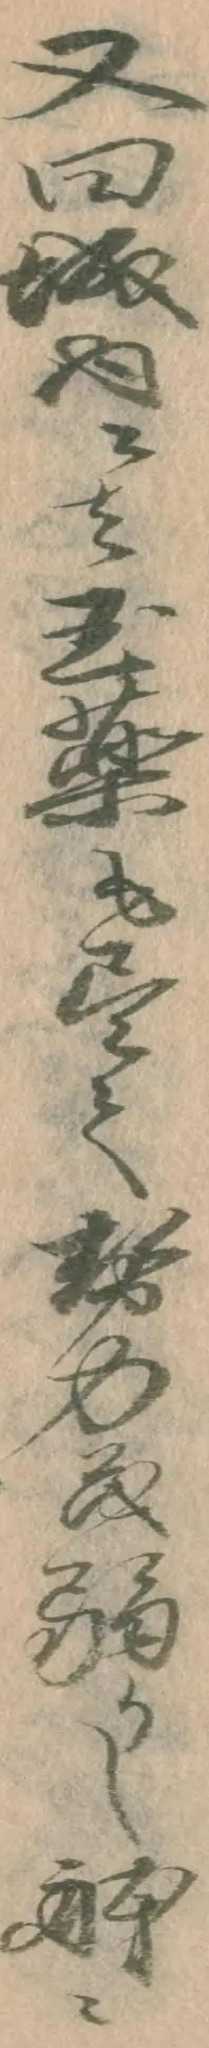又曰城内に者玉薬も尽て勢力茂弱りし躰に
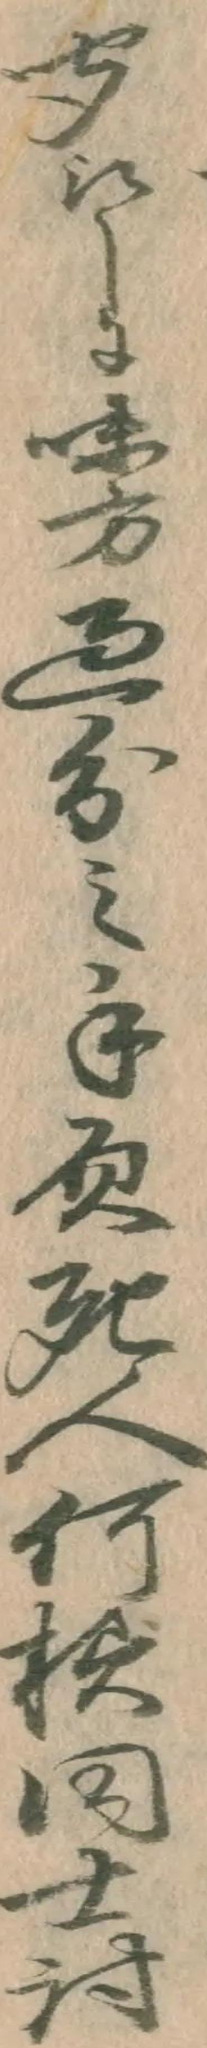聞江し尓味方過分之手負死人何様同士討
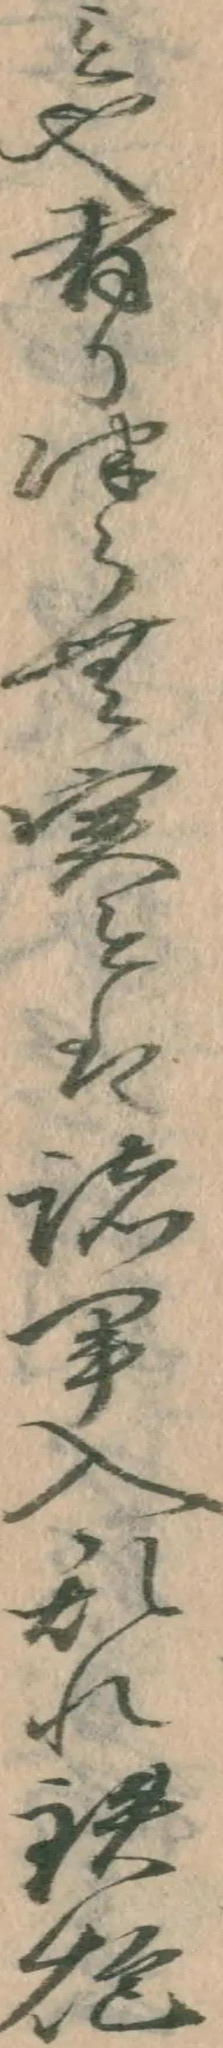もや有り津ら無実と盤諸軍入乱れ鉄砲
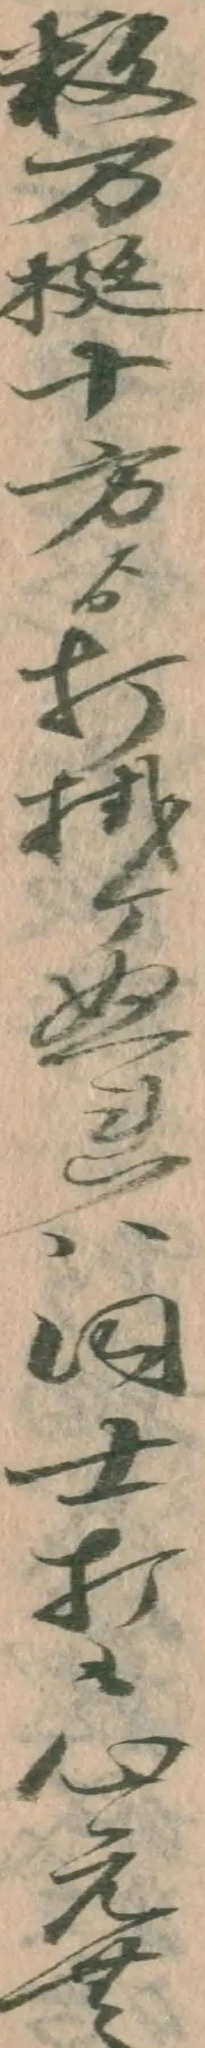数万挺十方ゟ打掛け怒連は同士打も心元無
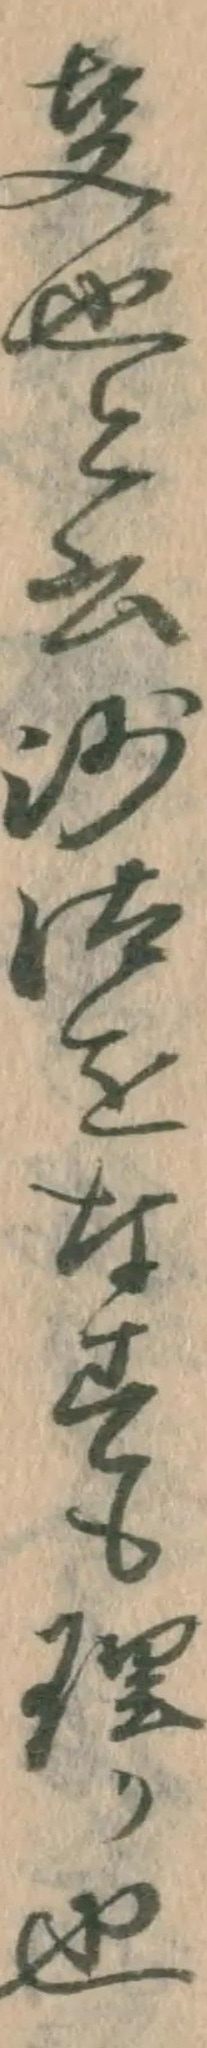事也と云沙汰をな春も理り也
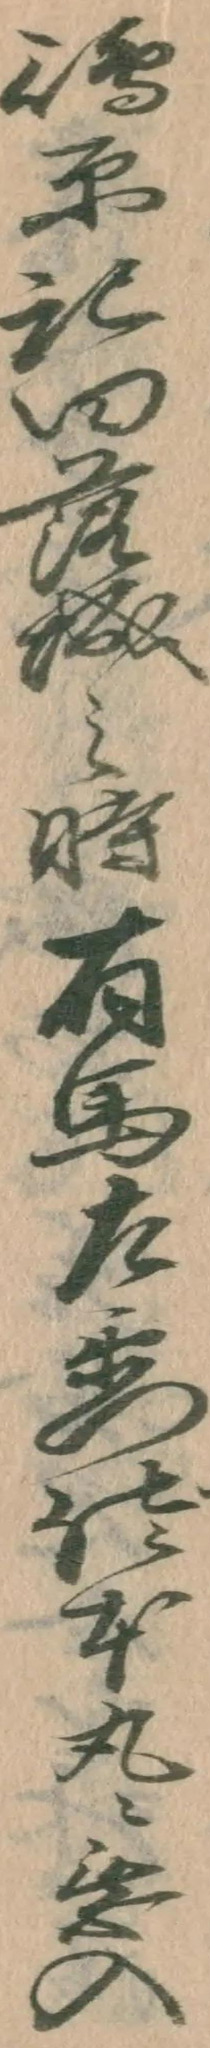島原記曰落城之時有馬左衛門佐本丸に乗入
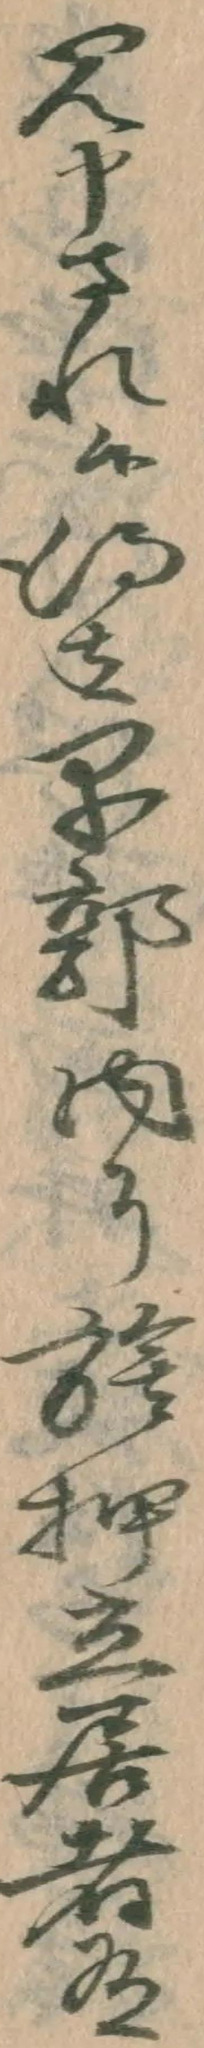見申され候得者早郭内に旗押立居者有
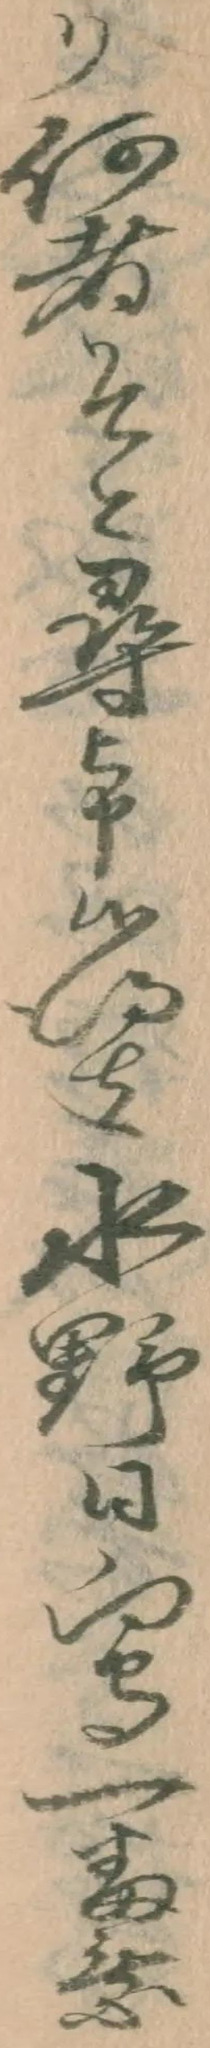り何者そと尋被申候得者水野日向守一番乗
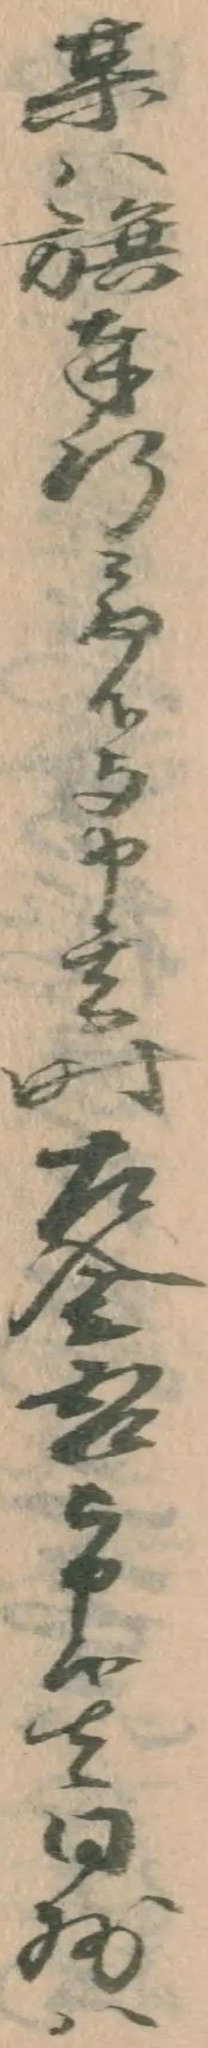某は旗奉行に而候与申其時左金吾被申候者日州は
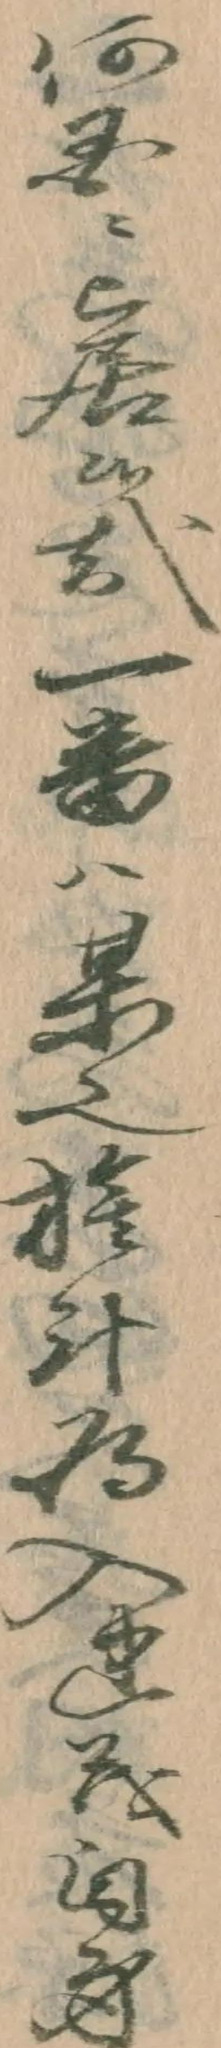何国に被居候一番は某也旗斗為入迚茂自身
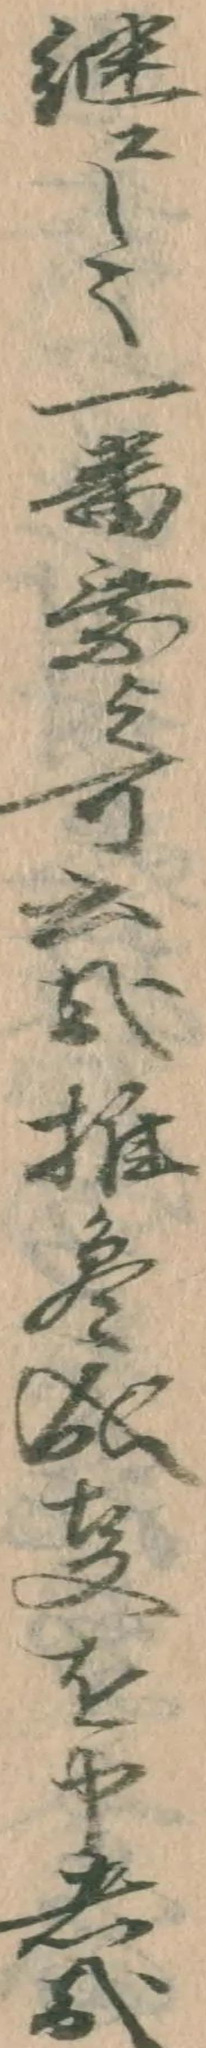継にして一番乗与可云哉推参成事を申者哉
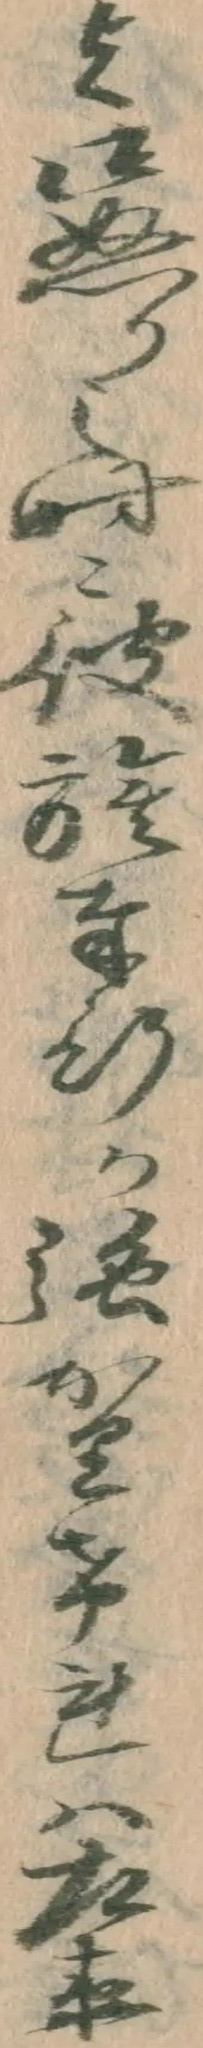与御怒り之時に彼旗奉行か強か里希連は左衛
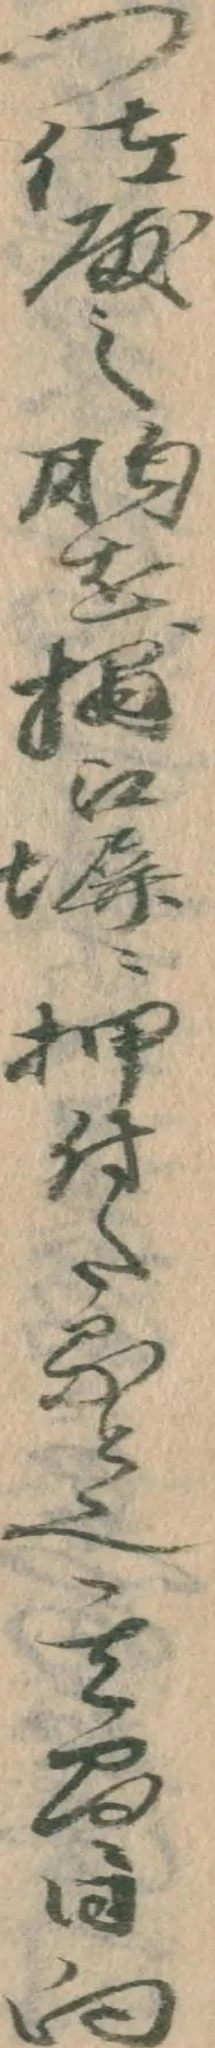門佐殿之胸を捕江塀に押付た累と也其間に日向
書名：切支丹御退治記 49巻. [8]
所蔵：国立国会図書館 National Diet Library, JAPAN
